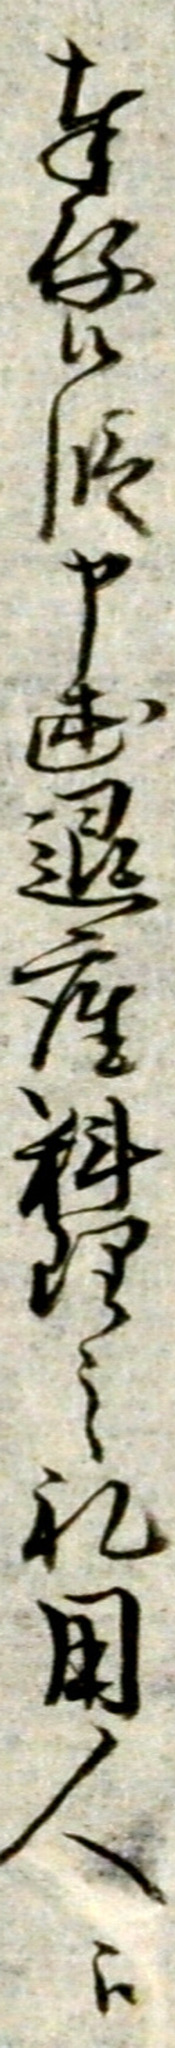奉存候段申述退座料理之礼用人江
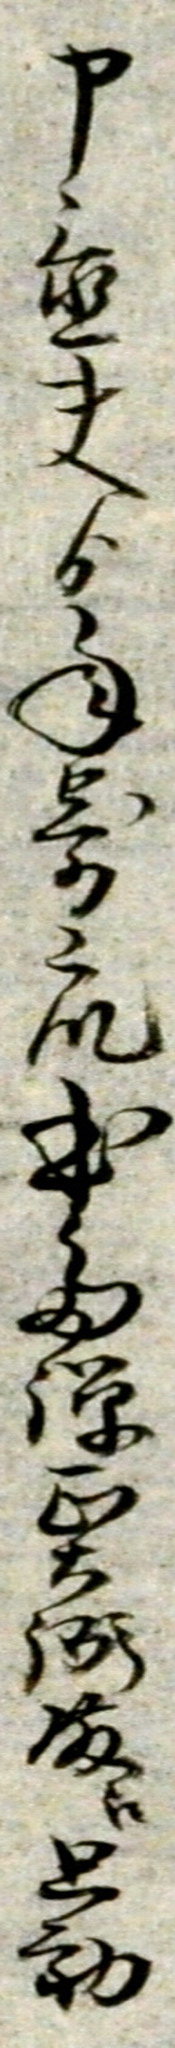申置夫ゟ年寄衆本多弾正大弼殿江廻勤
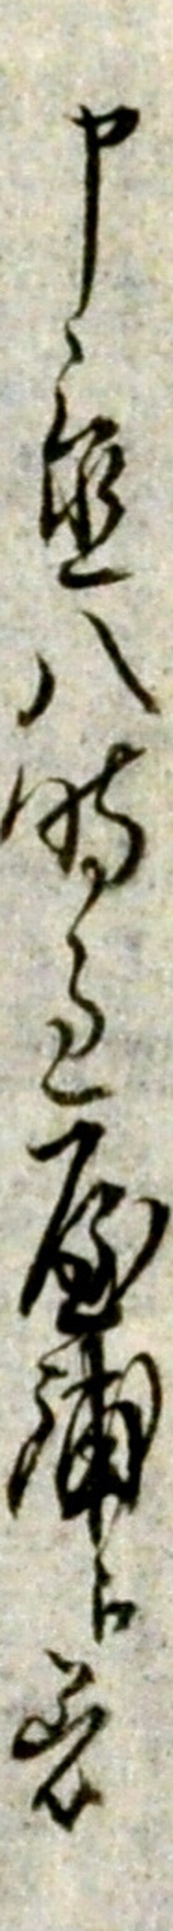申置八時過屋鋪江着
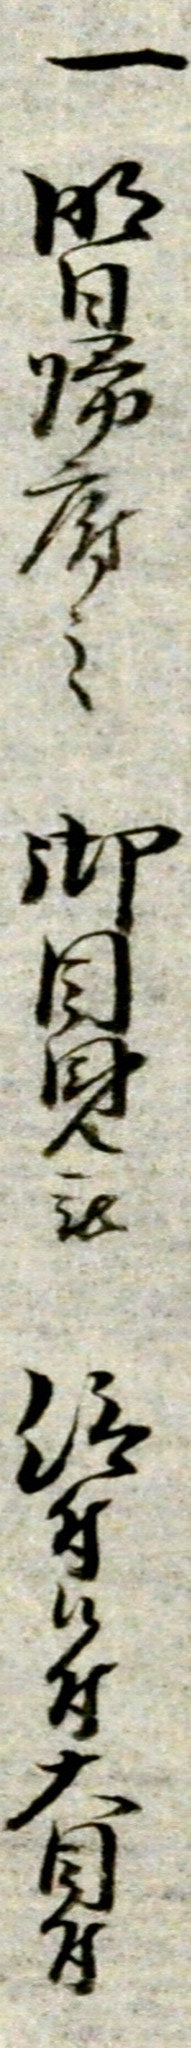一明日帰府之御目見被仰付候付大目付
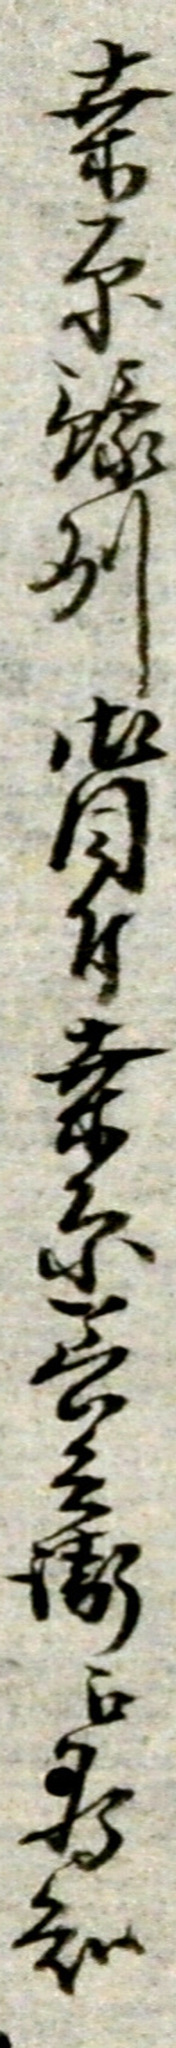桑原予州御目付桑原善兵衛江為知
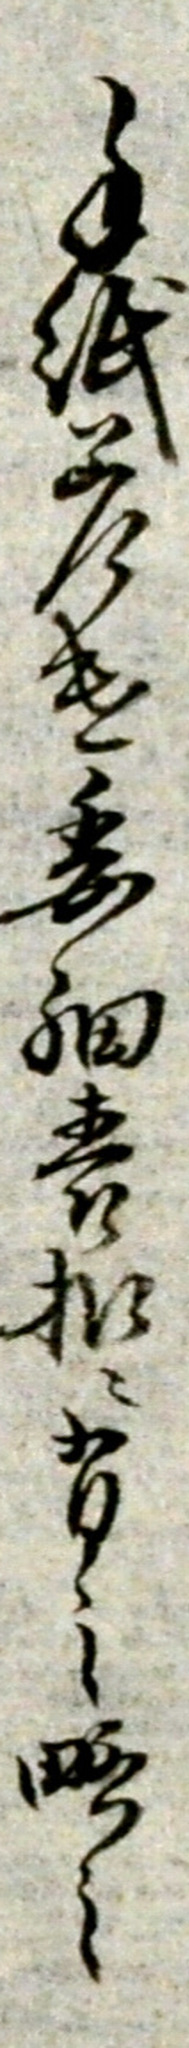手紙差遣委細表扣ニ有之略之
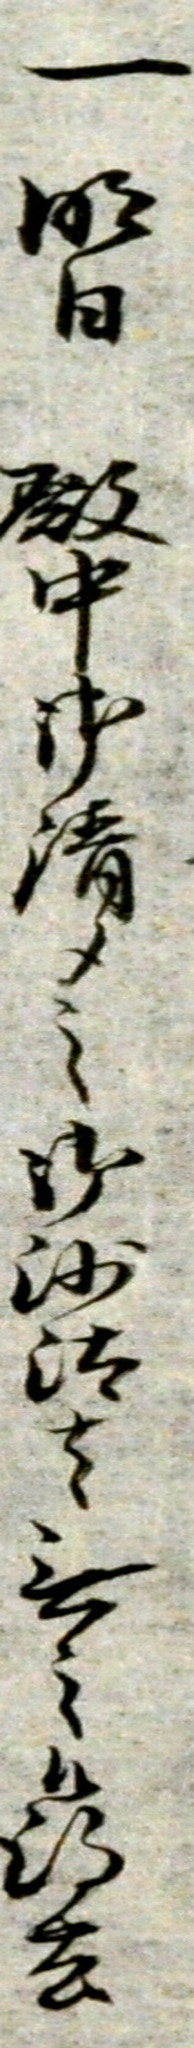一明日殿中御清メ之御沙汰者無之候得共

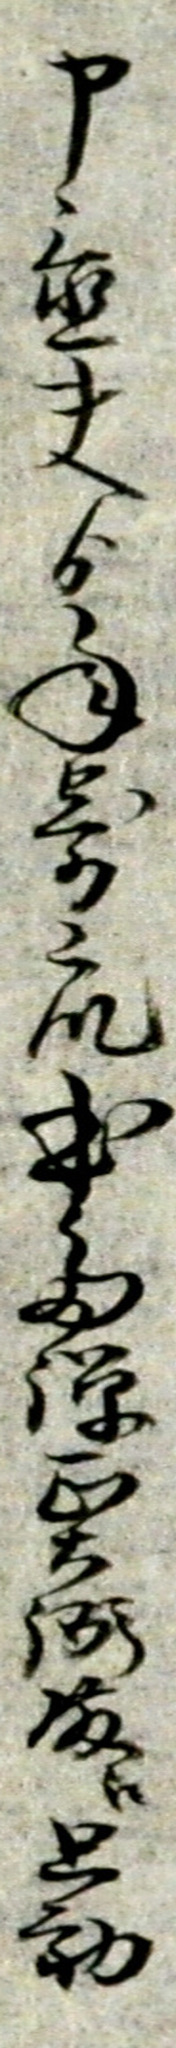申置夫ゟ年寄衆本多弾正大弼江廻勤
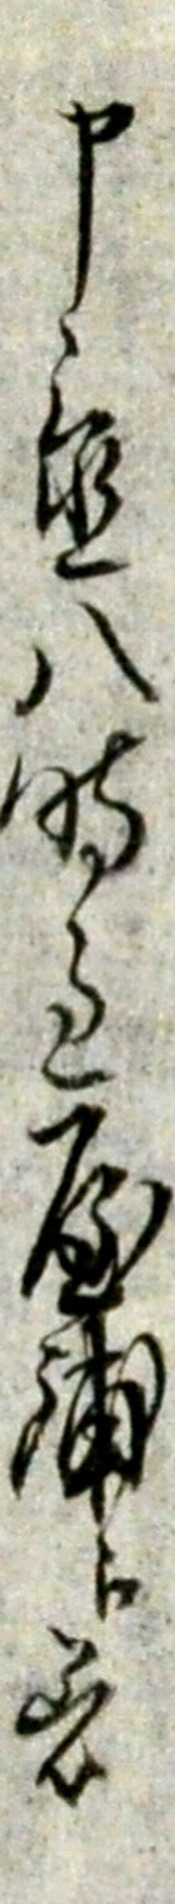申八時過屋舗江着
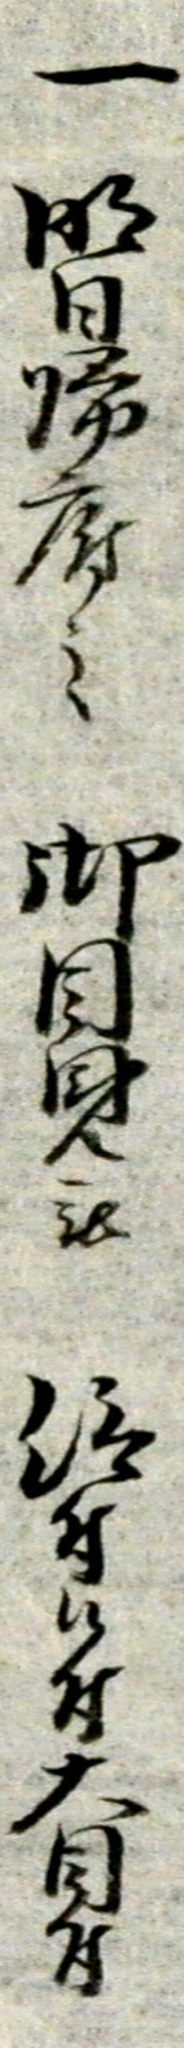一明日帰府之御目見被仰付候付大目付
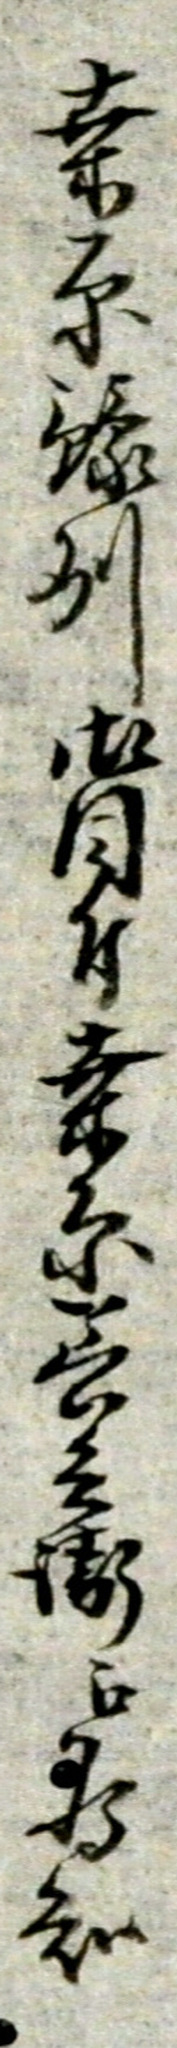桑原予州御目付桑原善兵衛江為知
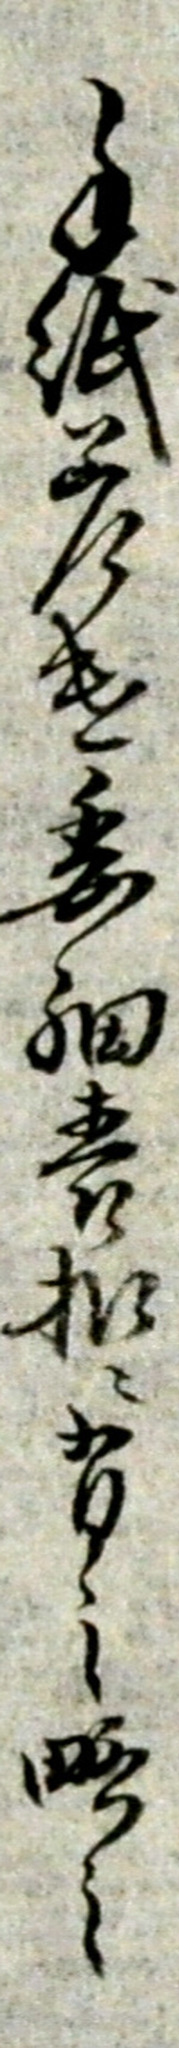手紙差遣委細表扣ニ有之略之
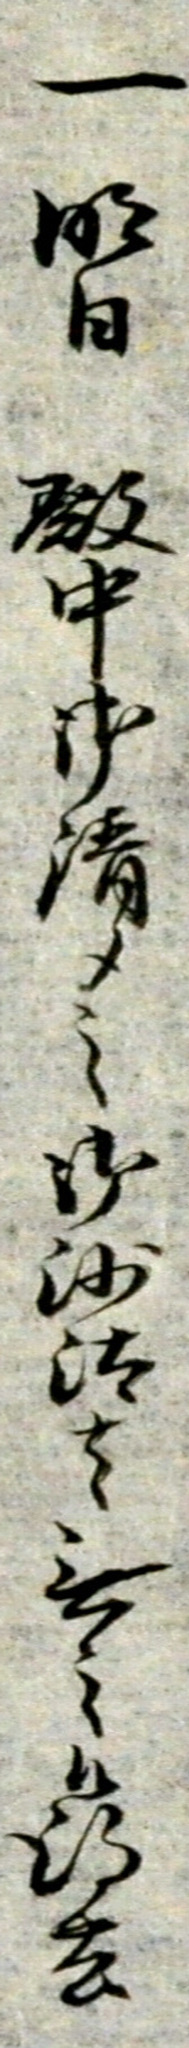一昨日殿中御清メ之御沙汰者無之候得共
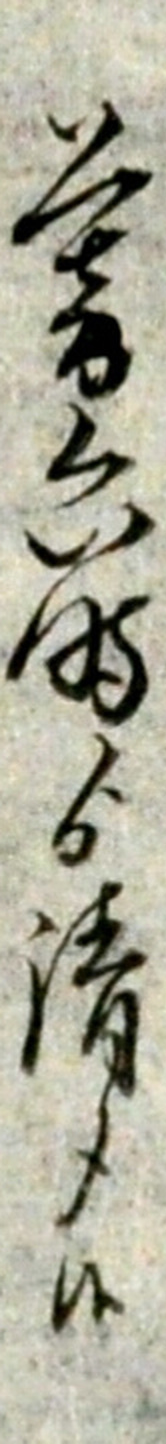暮六時ゟ清〆候
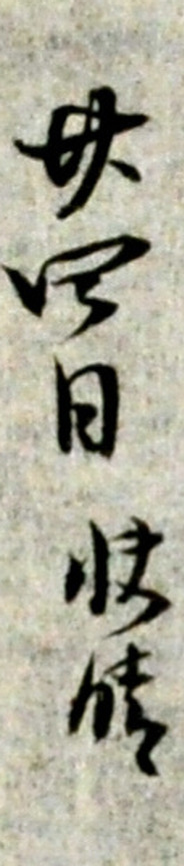廿四日快晴
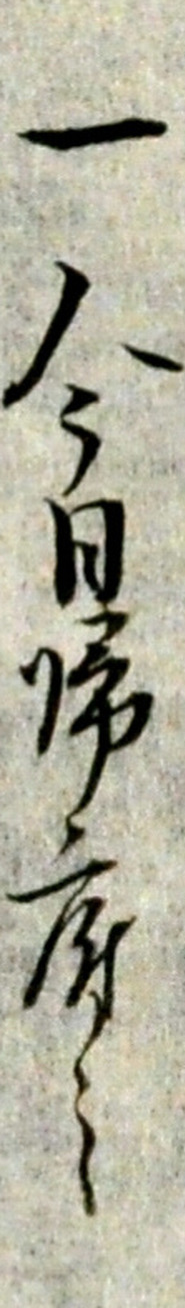一今日帰府之
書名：日光御名代相勤候節ノ留
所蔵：伊那市立高遠町図書館・合同会社AMANE
